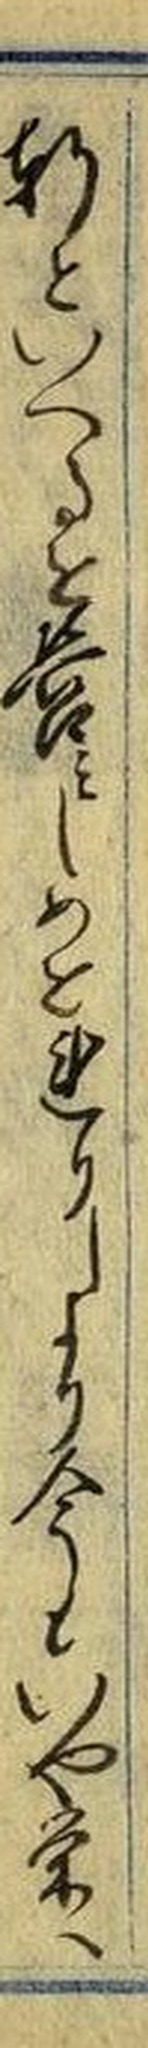軒といへるを営みしめをれりしより今もいや栄へ
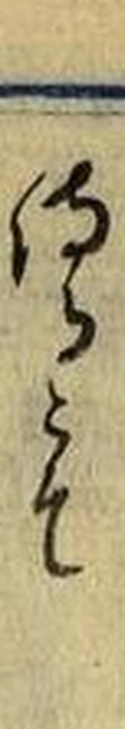侍るとそ
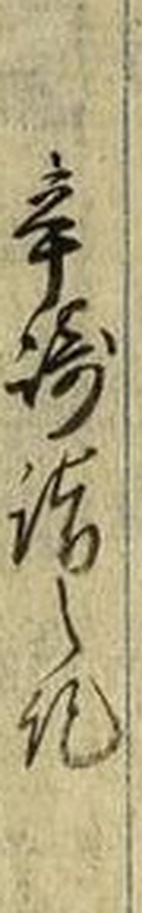辛崎詣之記
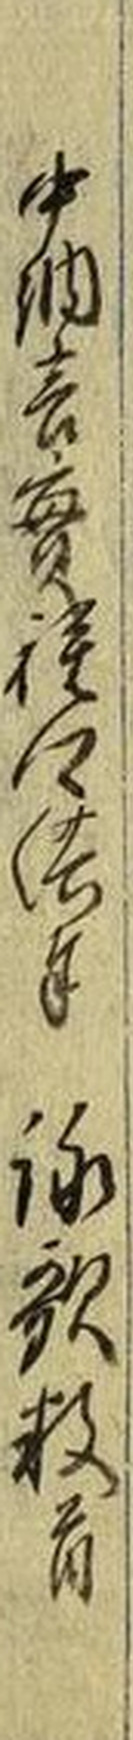中納言實禮卿供奉詠歌数首
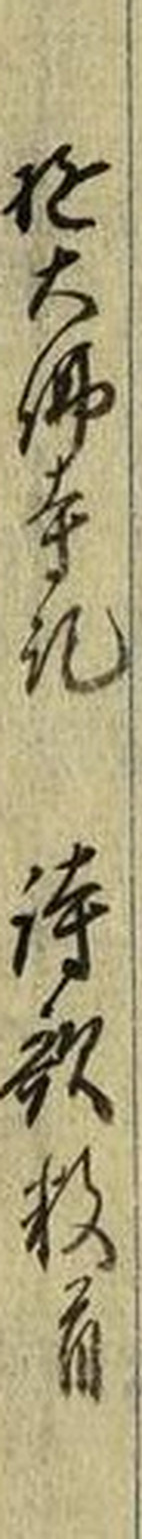遊大場寺記詩歌数首
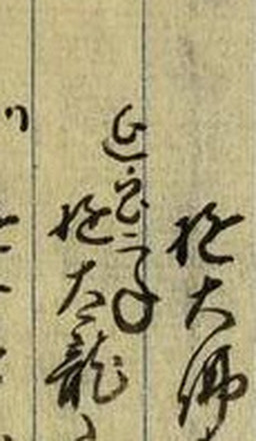延宝二年
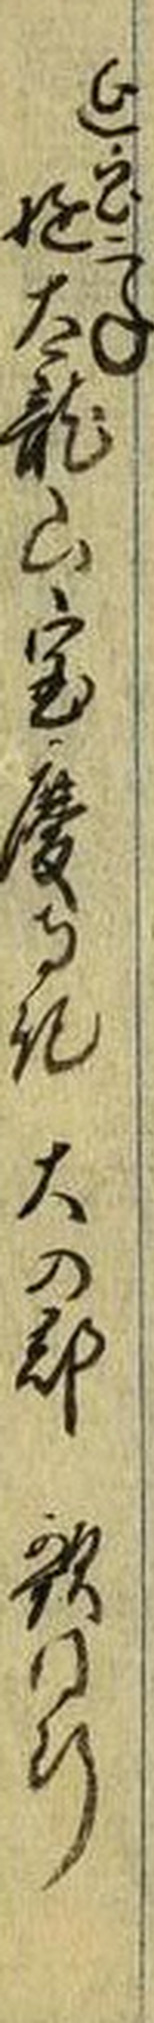遊大龍山宝慶寺記大の郡歌同断
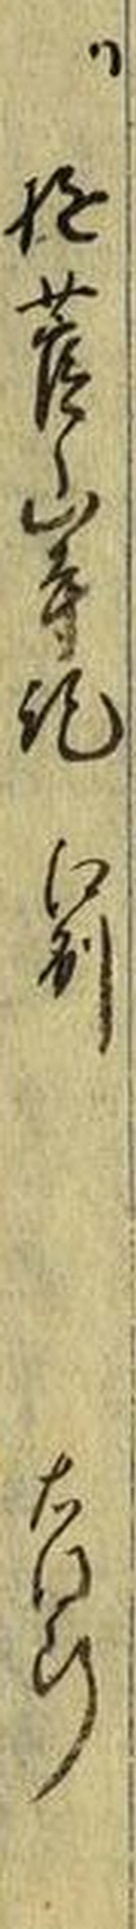遊菅山寺記江州右同断
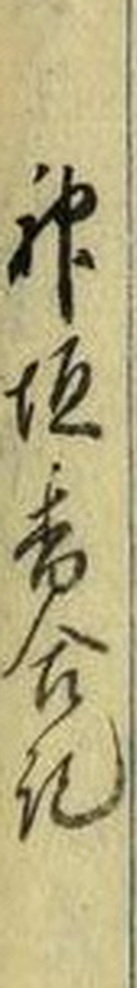神垣香合記
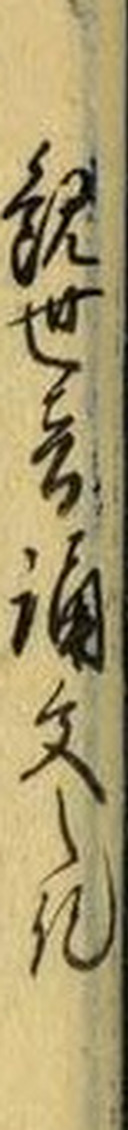観世音誦文之記
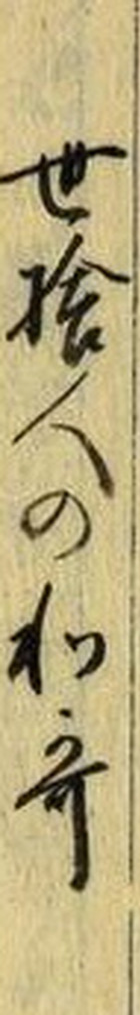世捨人の和哥
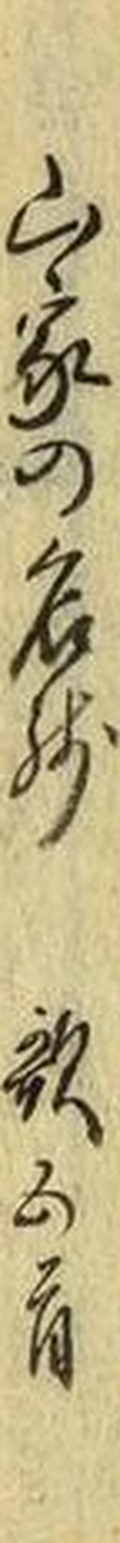山家の名残歌五首
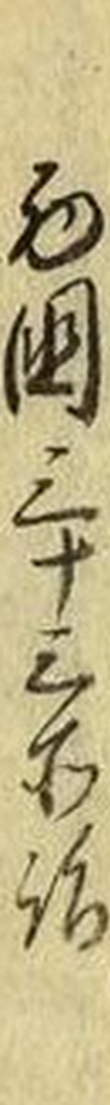西国三十三所詣
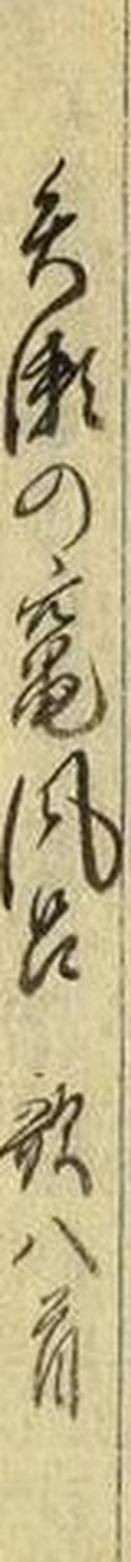矢瀬の竃風呂歌八首
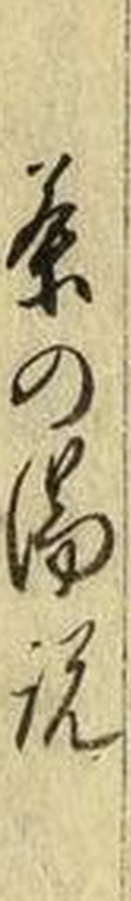茶の湯祝
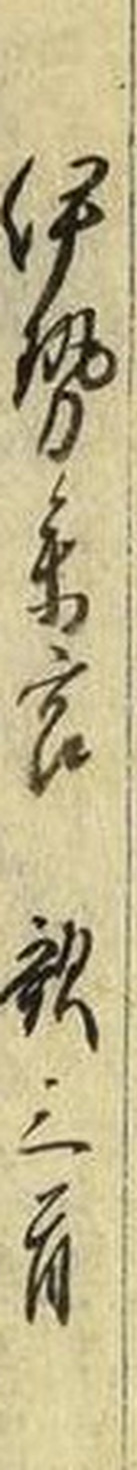伊勢参宮歌三首
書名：温古集 三巻
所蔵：福井県文書館 Fukui Prefectural Archives
